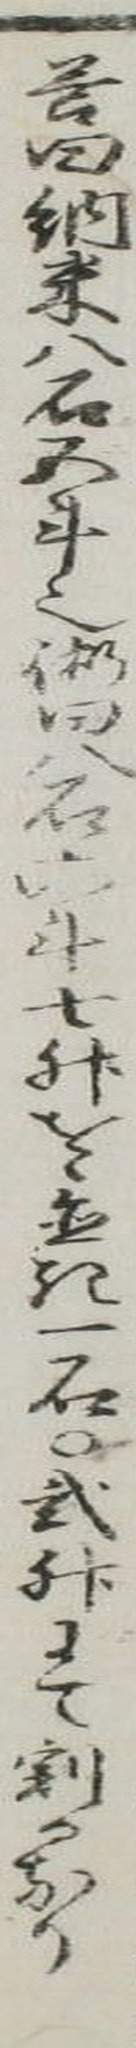答曰納米八石五斗也術曰八石六斗七升を置き一石〇弐升にて割るなり
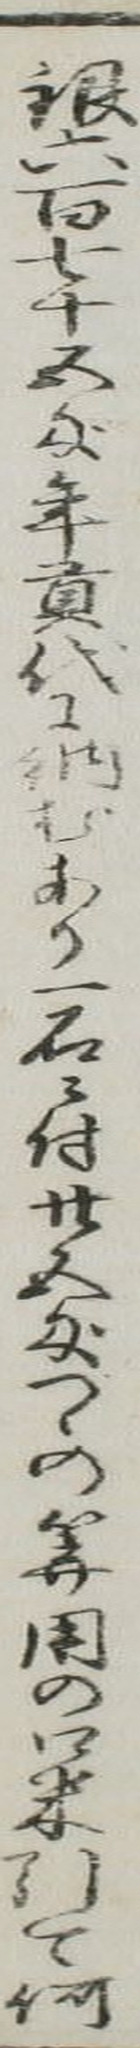銀六百七十五匁年貢代に納むあり一石に付廿五匁づゝの算用の口米引て何
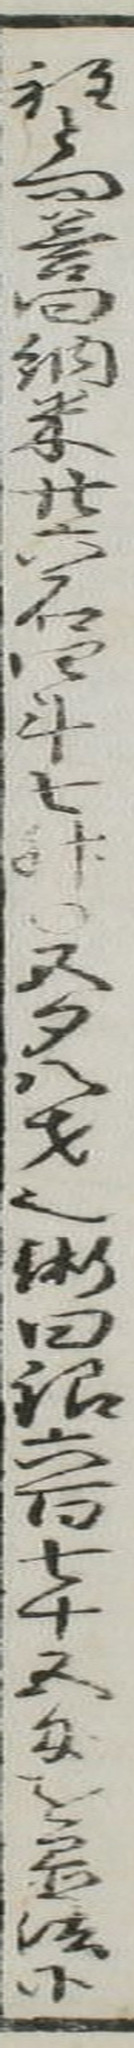程と問答曰納米廿六石四斗七升〇五勺八才也術曰銀六百七十五匁を置法に
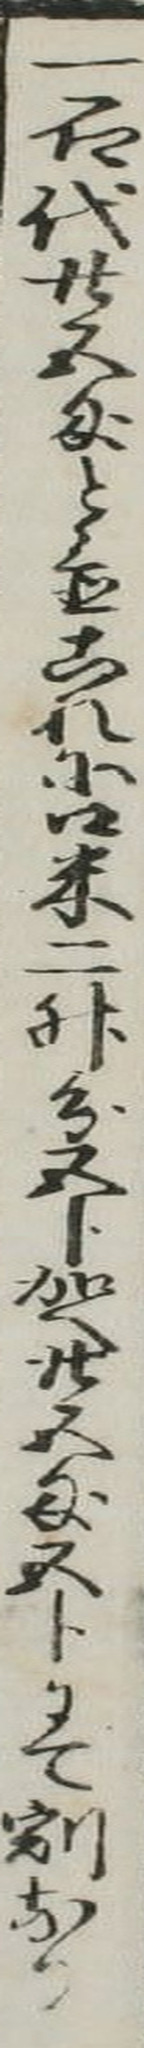一石代廿五匁と置これに口米二升分五分加へ廿五匁五分にて割なり
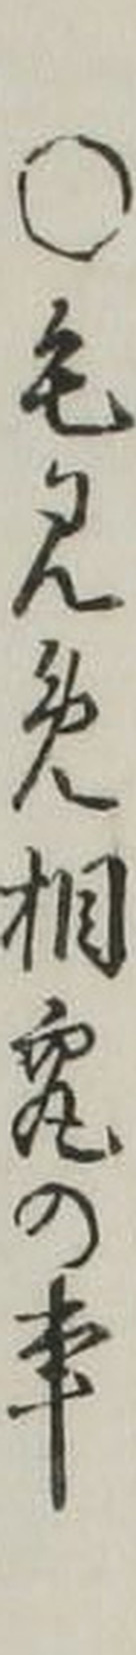○毛見免相究の事
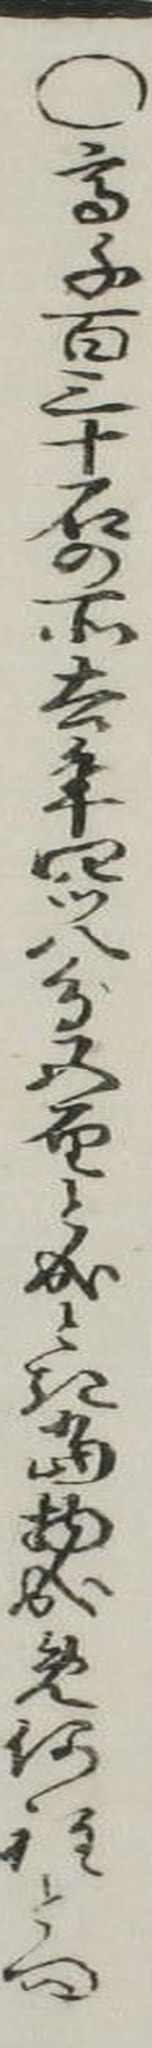○高千百三十石の所去年四ツ八分五厘と成とき当物成免成程と問
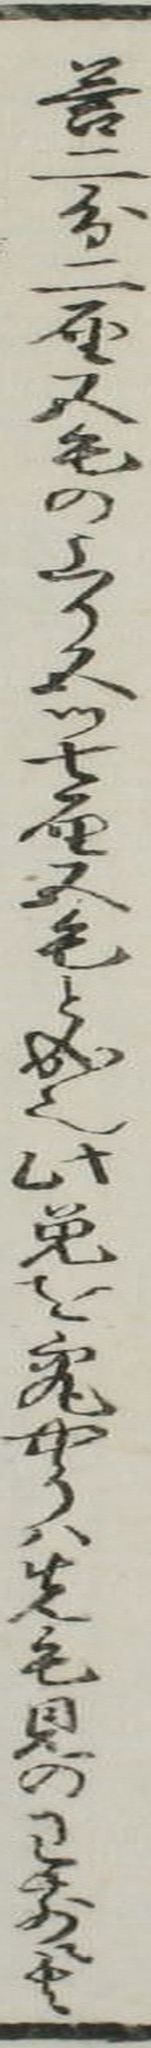答二分二厘五毛の上り五ツ七厘五毛と成也此免を究やうは先毛見の已前に其
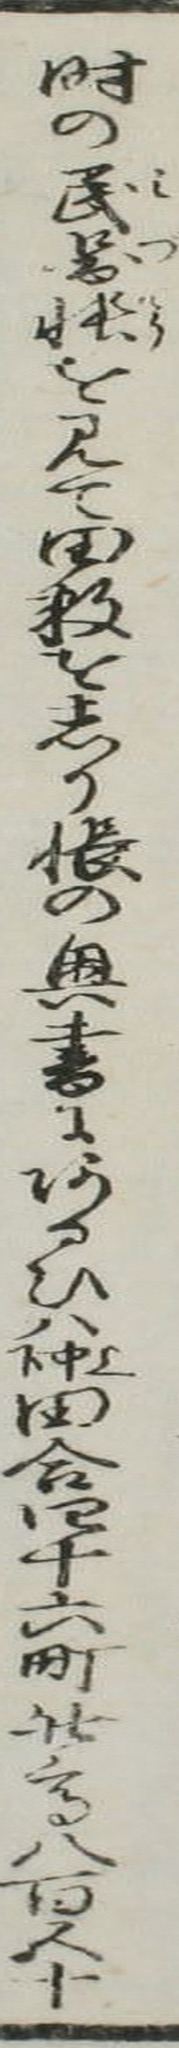時の民図帳を見て田数をしり帳の奥書にあるひは上中下田合四十六町此高八百五十
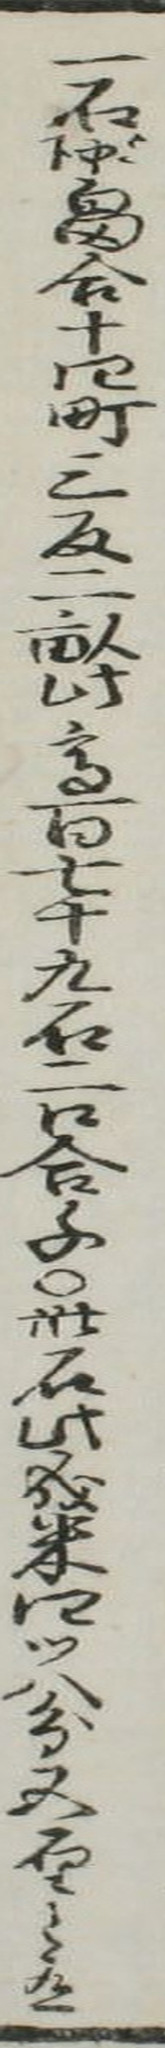一石上中下畠合十四町三反二畝此高百七十九石二口合千〇卅石此成米四ツ八分五厘と有
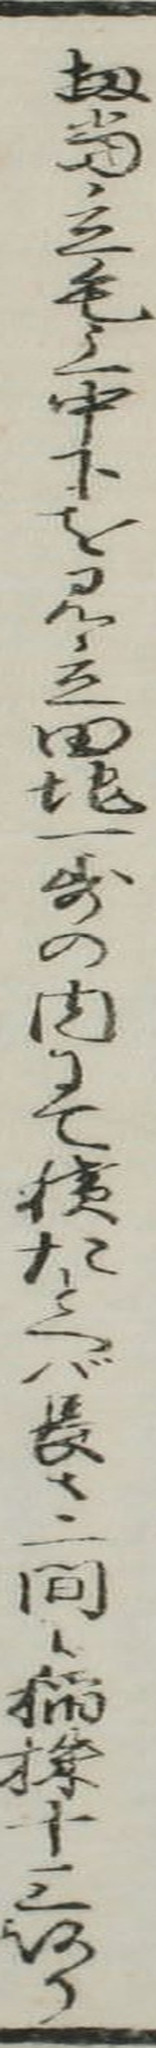扨当立毛上中下を見立田地一歩の内にて積たとへば長さ一間に稲株十三あり
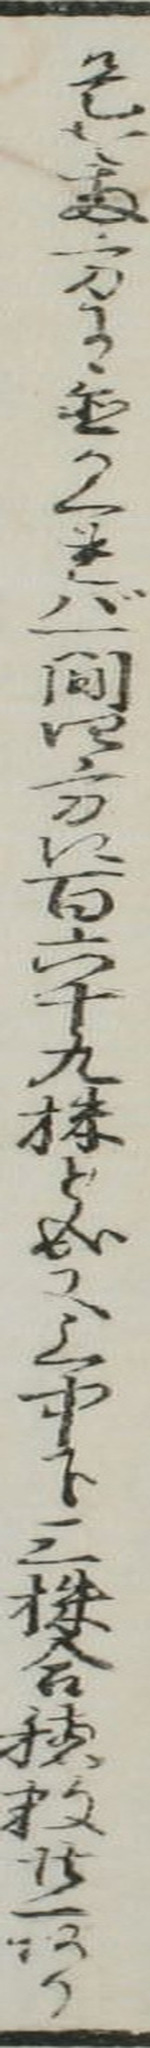是を両方に置かくれば一間四方に百六十九株と成又上中下三株合穂数廿一あり
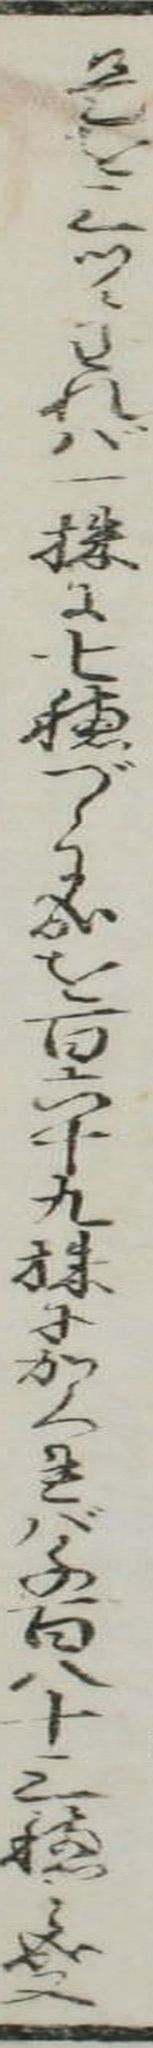是を三ツにわれば一株に七穂づゝに成を百六十九株にかくれば千百八十三穂と成又
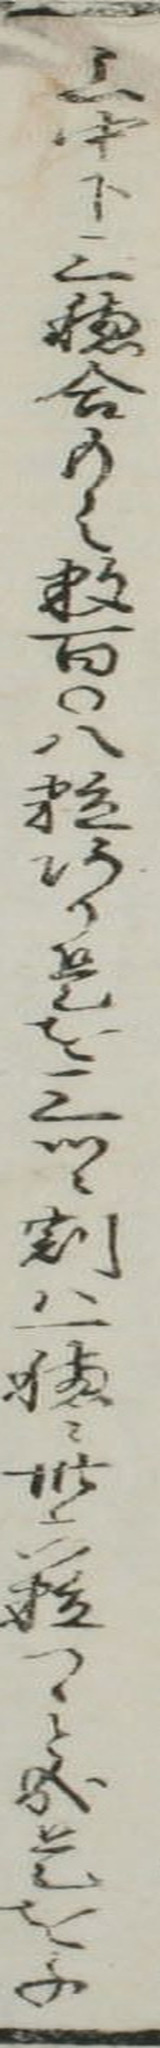上中下三穂合もみ数百〇八粒あり是を三ツに割は一穂に卅六粒つゝと成是を千
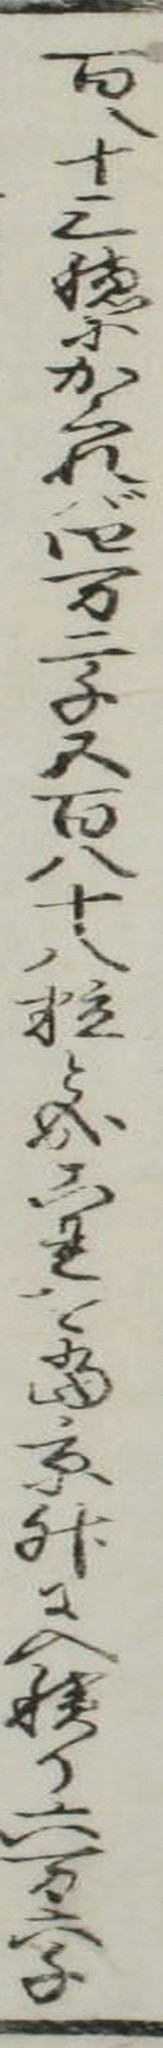百八十三穂にかくれば四万二千五百八十八粒と成これを当京升に入積り六万六千
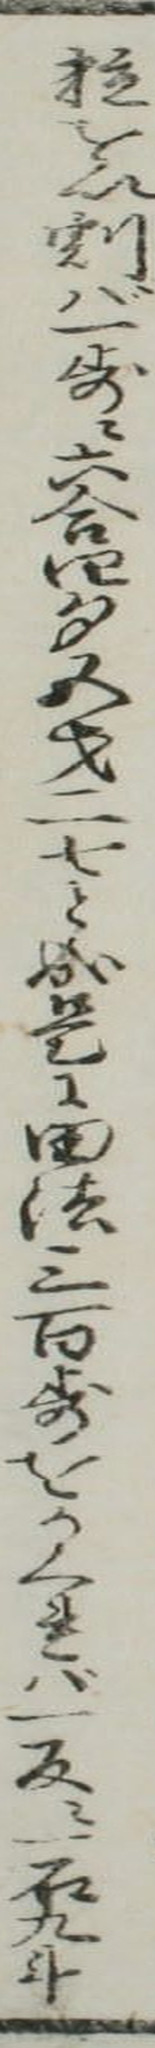粒を以割ば一歩に六合四勺五才二七と成是に田法三百歩をかくれば一反に一石九斗
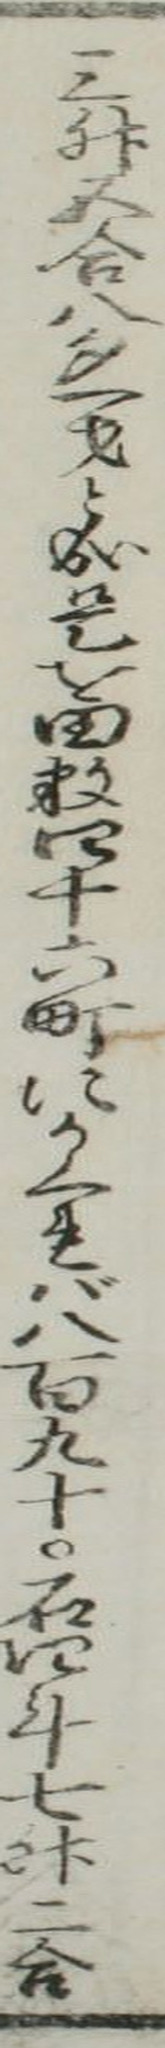三升五合八勺一才と成是を田数四十六町にかくれば八百九十〇石四斗七升二合
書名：宝玉塵劫記
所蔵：東京学芸大学教育コンテンツアーカイブ
